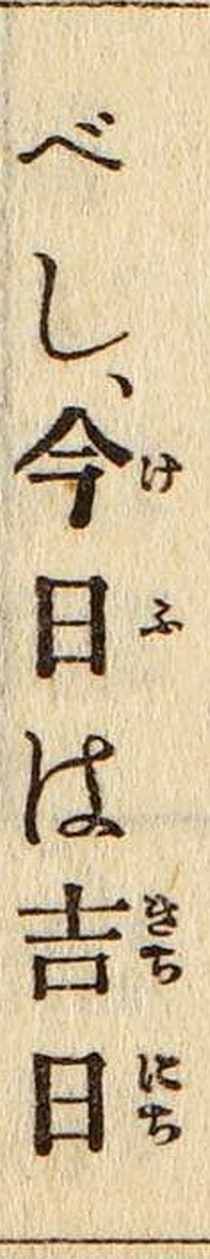べし、今日は吉日
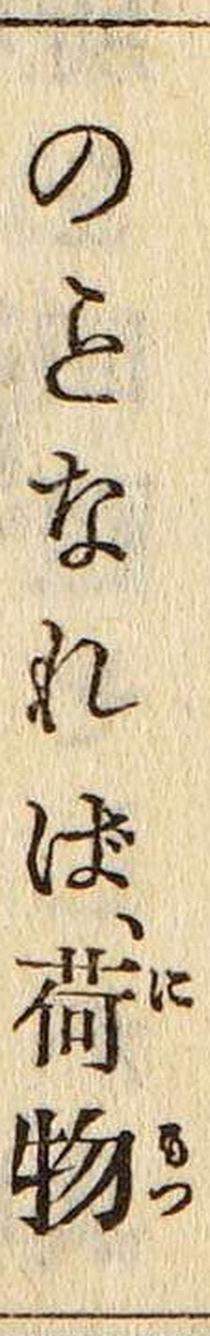のことなれば、荷物
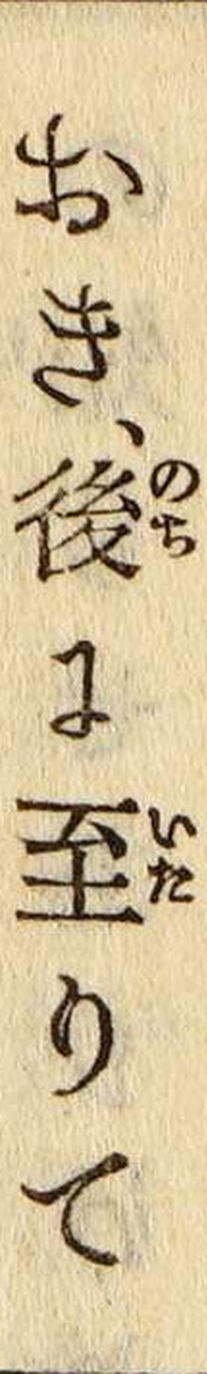おき、後に至りて
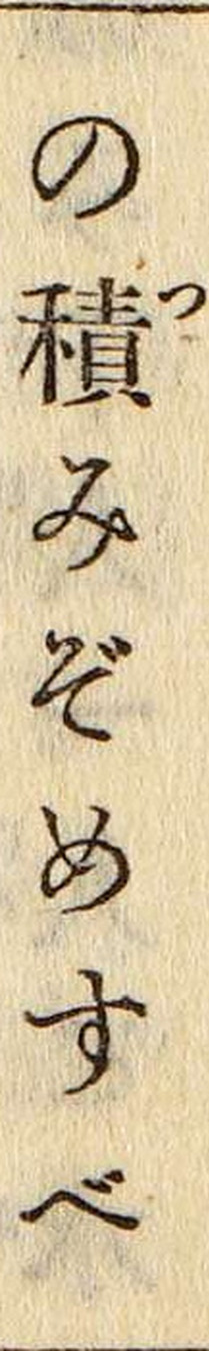の積みぞめすべ
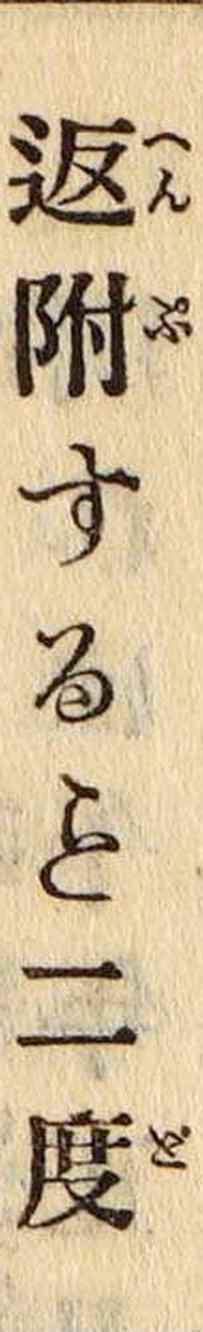返附すること二度
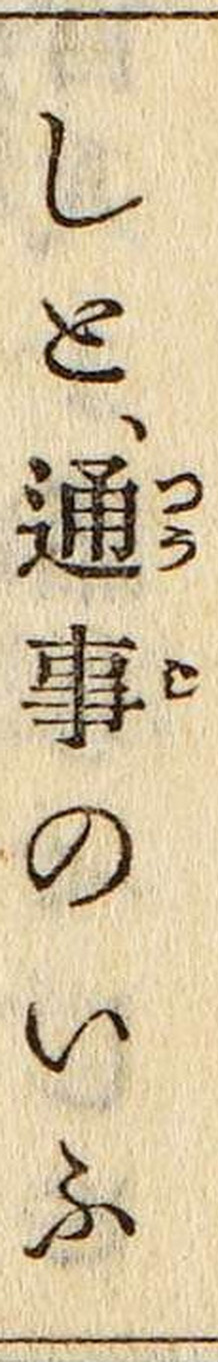しと通事のいふ
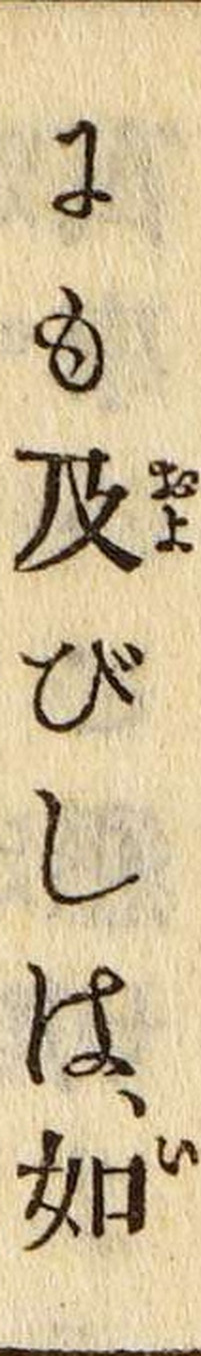にも及びしは如
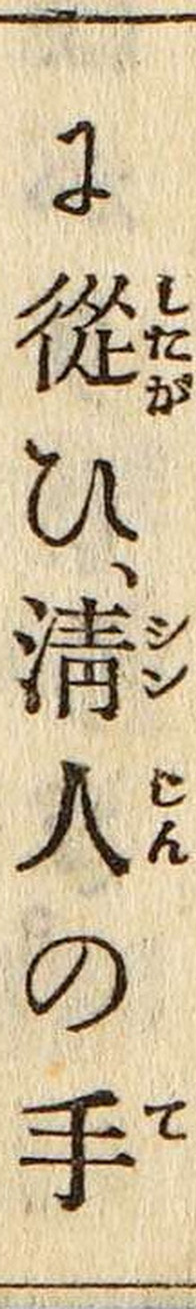に從ひ、清人の手
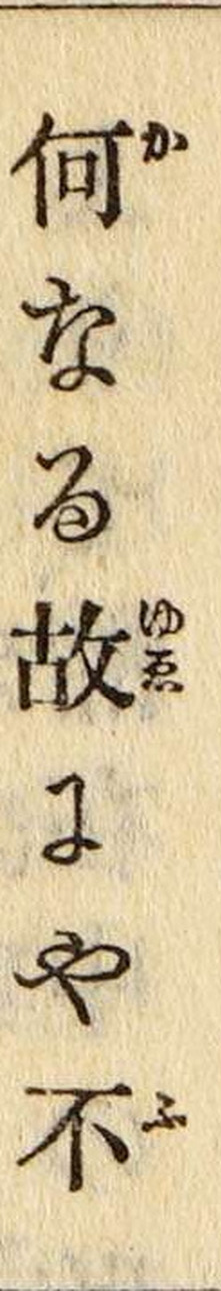何なる故にや不
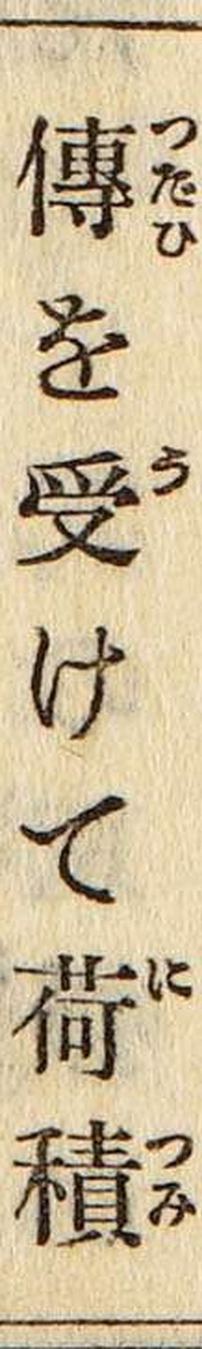伝を受けて荷積
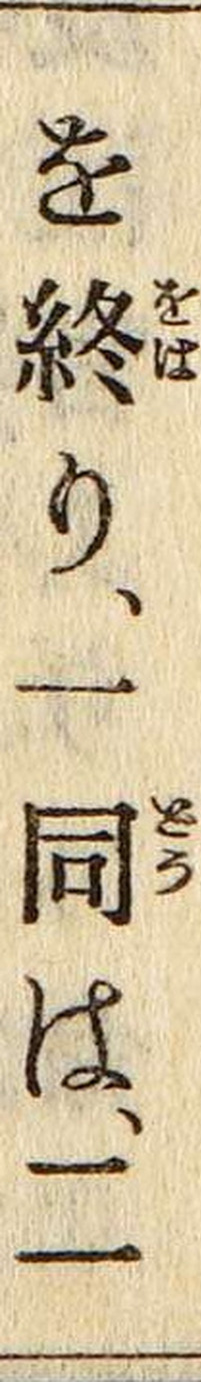を終り、一同は二
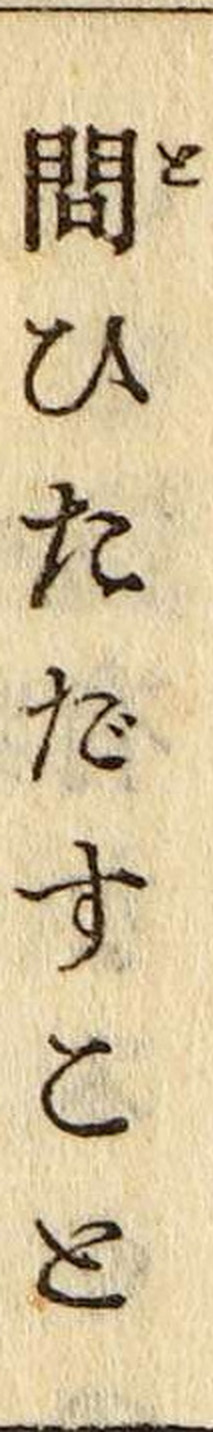問ひただすこと
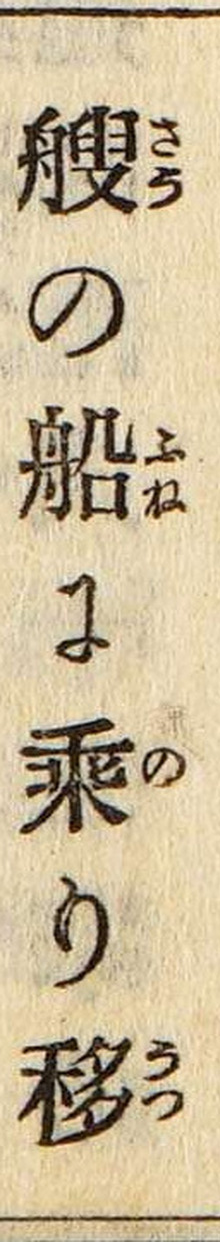艘の船に乗り移
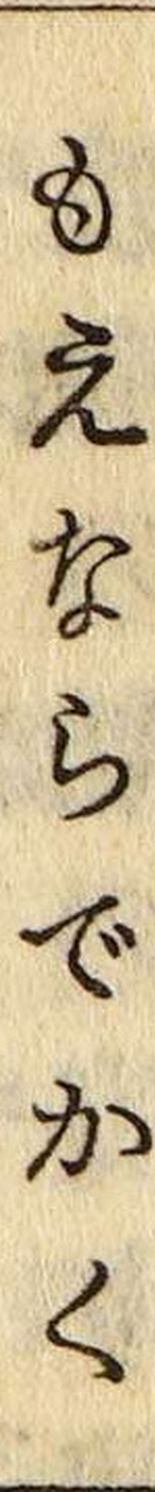もえならでかく
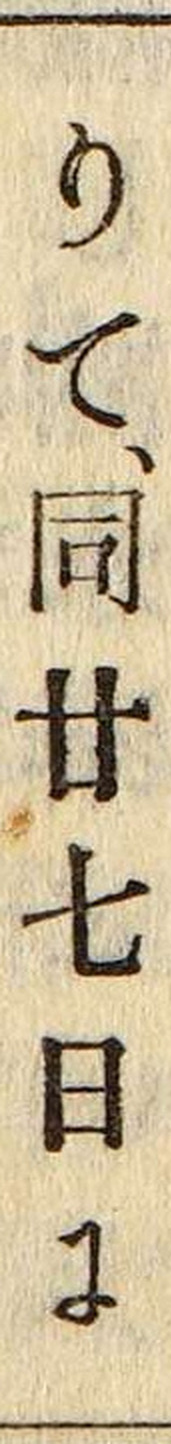りて、同廿七日に
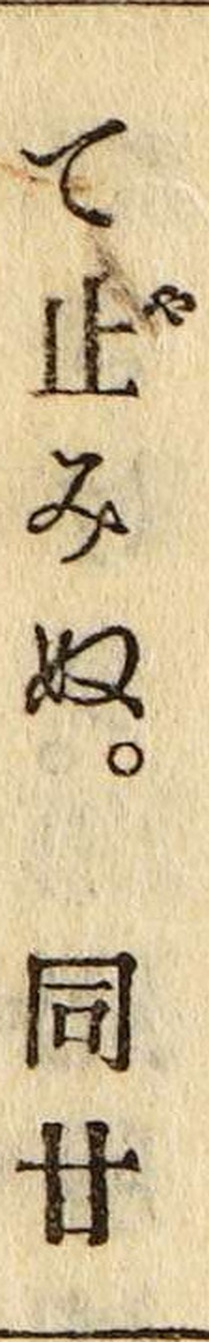て止みぬ。同廿
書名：日本漂流譚
